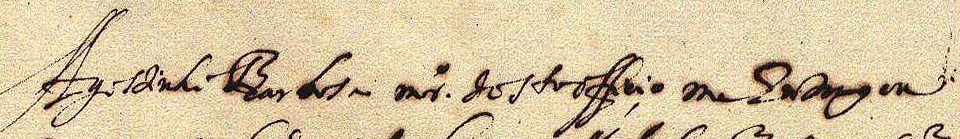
Agostinho Barbosa mro. do sto officio me Entregou
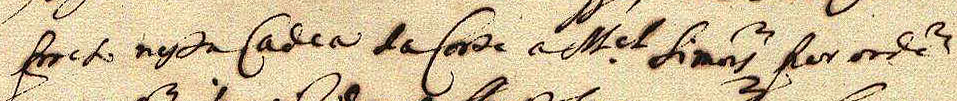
preso nesta Cadea da Corte a M.el Simoĩs por ordē
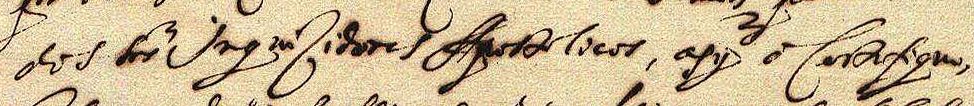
dos sor̄ Inquizidores Apostolicos, asȳ o Certifiquo,
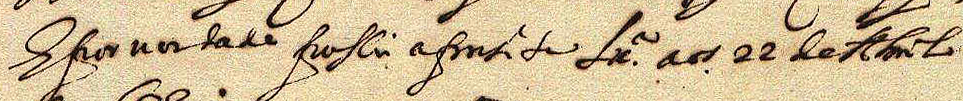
E por uerdade passei a presēte Lx.a aos 22 de Abril
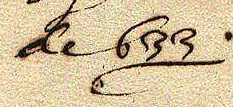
de 633.
